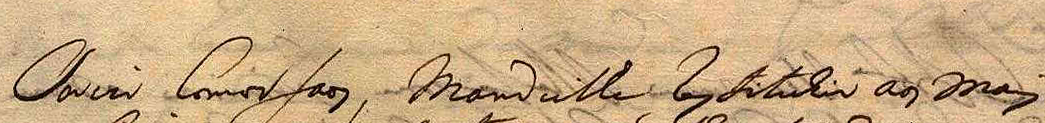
Servir Com orfaos, Mandeilhe Restituhir aos mais
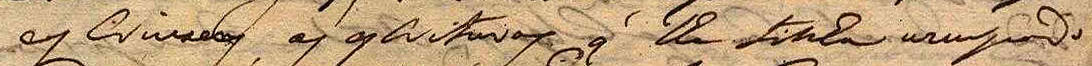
esCrivaes, as escrituras q̄ lhe tinha uzurpado
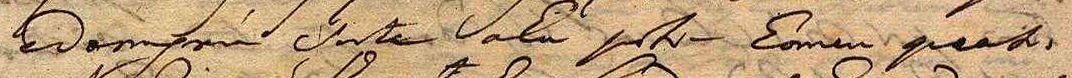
e da mesma sorte a hu posto- homen quatro
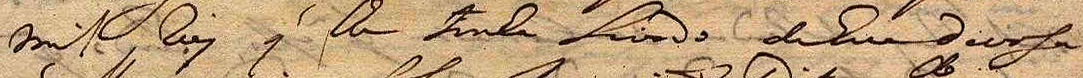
mil Reis q̄ lhe tinha Levado de hua devasa
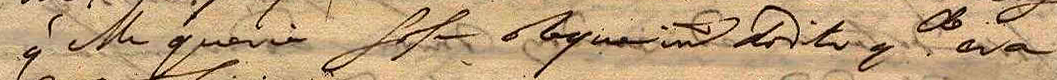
q̄ elle queria fose o Requerimto do dito q.do era
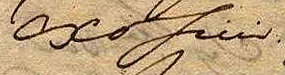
ex oficio.
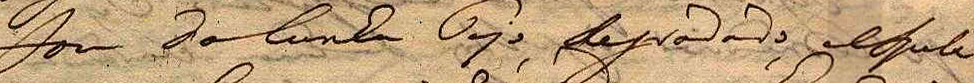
Joze da Cunha Fejo, degradado, e Apela
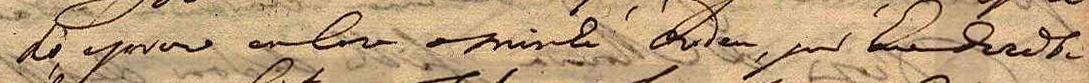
do, e prezo em Caza a minha orden, por hua dezobe
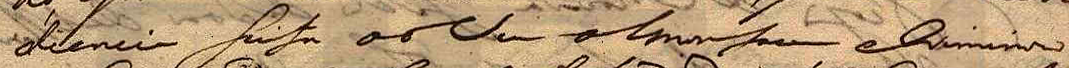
diencia feita ao Seu almortace, e Criminozo
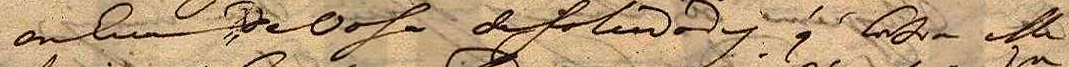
en hua devasa de falcidades q̄ Contra elle
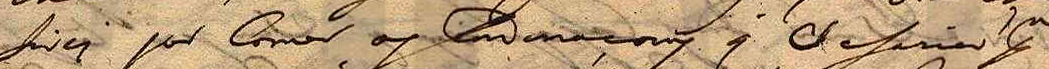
Jurei por Correr as Condenaçons q̄ Se fariaõ p.r
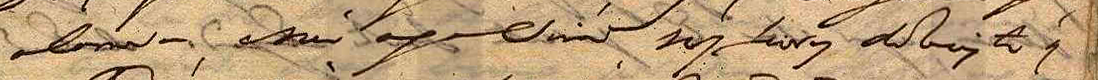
a Correr-, e naõ o q seria nos Livros do Visto q̄
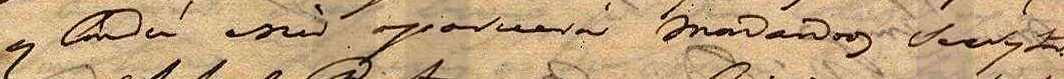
esCondeu e naõ aparecera madandoos secuestar
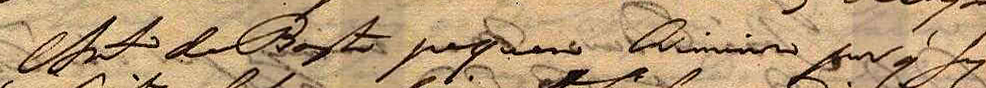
Anto de Basto pequeno Criminozo porq̄ fes
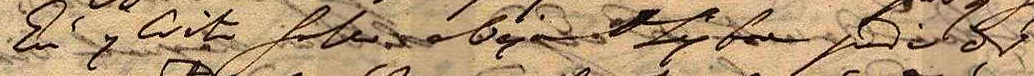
hū esCrito falço e vejo A Lisboa pedi dro
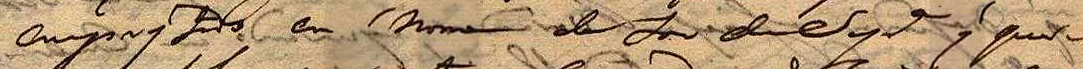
emporq tudo en nome de Joze de Seqr.a q̄ quar
